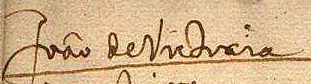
João de Victoria
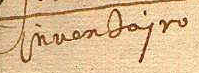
jnuentajro
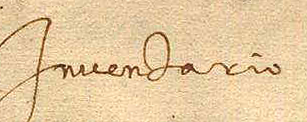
Jnuentario
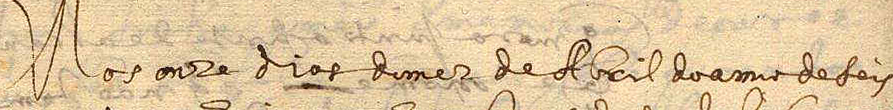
Aos onze dias do mez de Abril do anno de seis
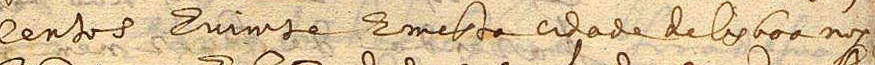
centos E uimte Em esta cidade de lisboa nos
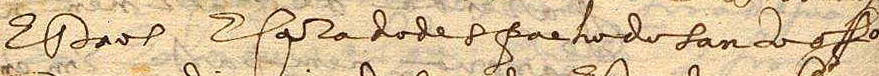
Estaos E Caza do despacho do santo offo
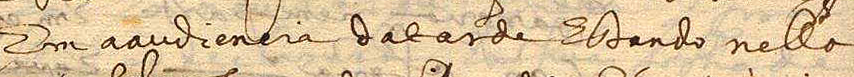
Em a audiencia da tarde Estando nella
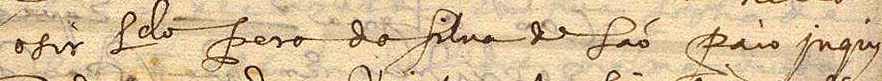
o sor̄ Ldo pero da silua de são paio Jnquj
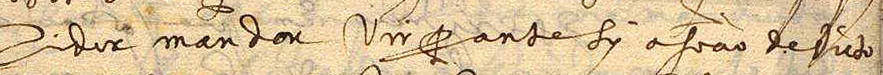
zidor mandou vir ꝑante sy a João de Victo
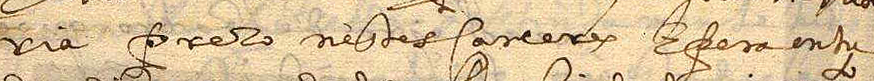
ria prezo nestes Carceres E pera en tu
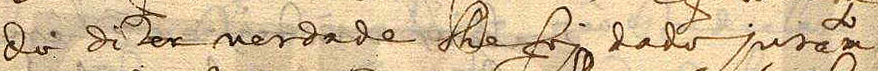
do dizer uerdade lhe foj dado juramto
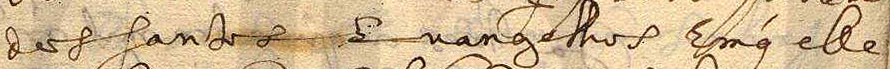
dos santos Euangelhos Em q̄ elle
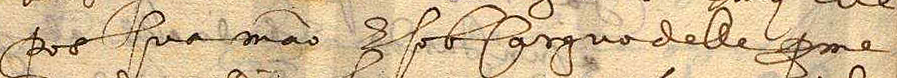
pos sua mão E sob Carguo delle ꝓme
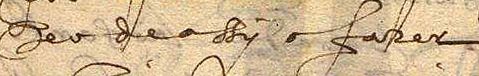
teo de assy o fazer
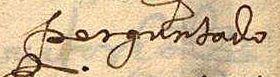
perguntado
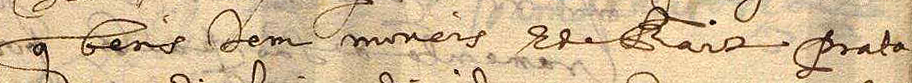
q̄ bens tem moueis E de Raiz prata
